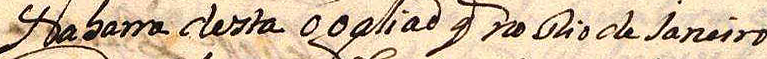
Na barra desta o galiaõ q̄ no Rio de Ianeiro
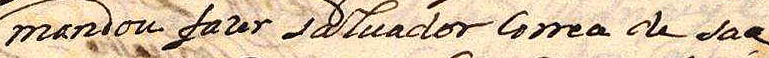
mandou fazer saluador correa de saa,
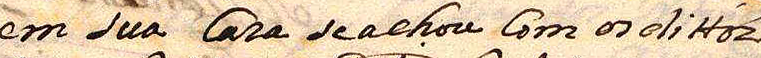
em sua Caza se achou Com os dittoz
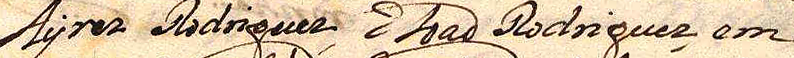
Ayrez Rodriguez, E Ioaõ Rodriguez, em
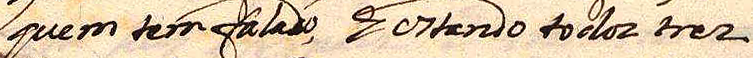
quem tem falado, E estando todoz trez
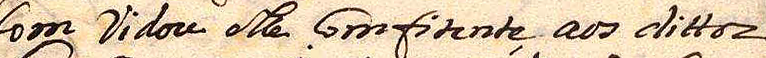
ComVidou elle Comfitente, aos dittoz
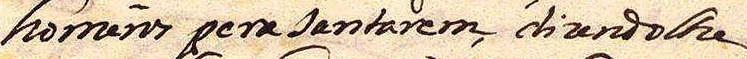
homeñs pera iantarem, dizendolhe
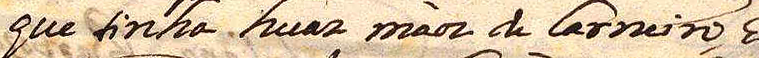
que tinha huaz mãoz de Carneiro, E
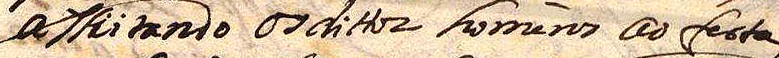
asseitando os dittoz homenñz a oferta
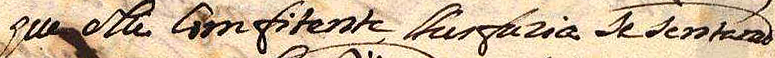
que elle Comfitente, lhes fazia se sentaraõ
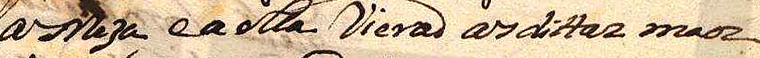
a Meza, e a ella Vieraõ as dittaz maoz
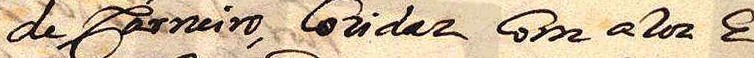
de Carneiro, Cozidaz Com aRoz E
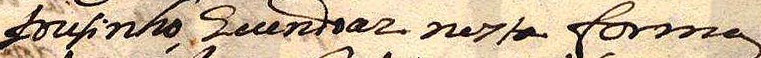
tousinho, E uendoaz nesta forma
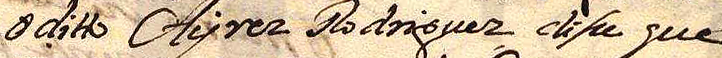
o ditto Ayrez Rodriguez, disse que
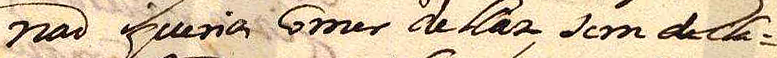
naõ queria comer dellaz, sem decla
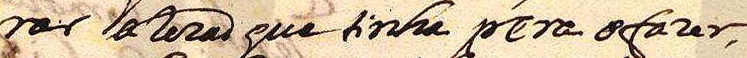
rar a rezaõ que tinha pera o fazer,
